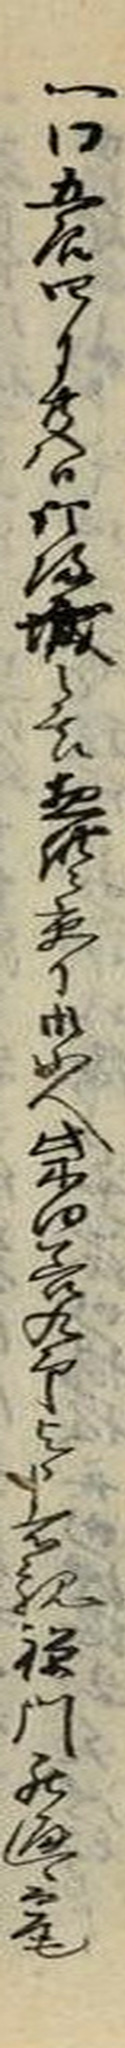一同五辰四月廿八日御帰城之節惣供に交り御小人柴田善九郎と申者親禅門罷通候而瓦
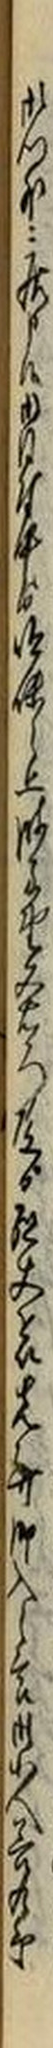御門外ニ居申候御目付中ゟ吟味之上波多野文右衛門殿ゟ組使を以先刻御入之節御小人善九郎
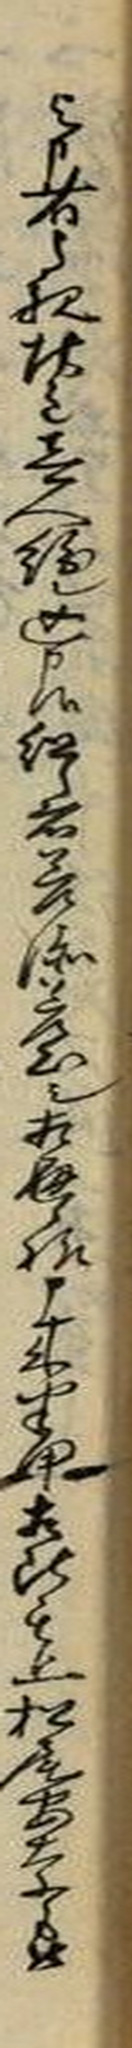と申者之親坊主壱人紛レ込申候組之者差添差出し相通候様申来半甲相断其上松尾安太夫も被
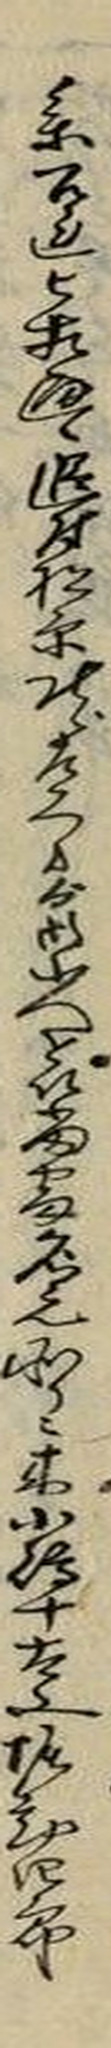参召連被相通候追付松原次郎左衛門方ゟ御小人を以当番名元承りに来小嶋十兵衛堀勘四郎
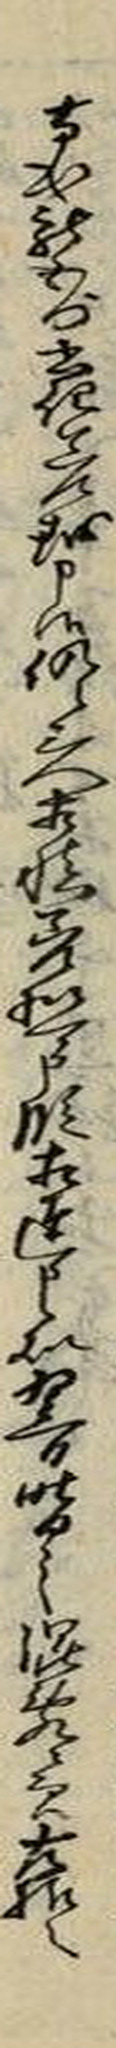高本新五右衛門書記差越申候仍之三人相慎差扣可申段相達申候処翌日昨日の之混敷に而は左様之
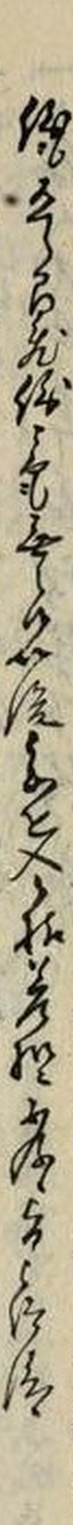儀も有之候間敷儀に而も無之候以後念を入候様差扣に不及旨被仰渡候
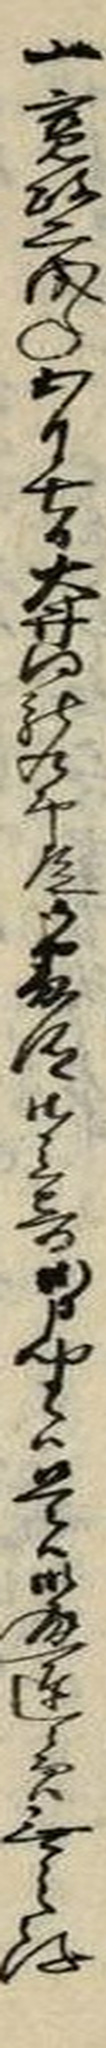一寛政二戌年五月七日大井田新九郎殿御番所御立寄御申聞候は是は御通達に而は無之被致
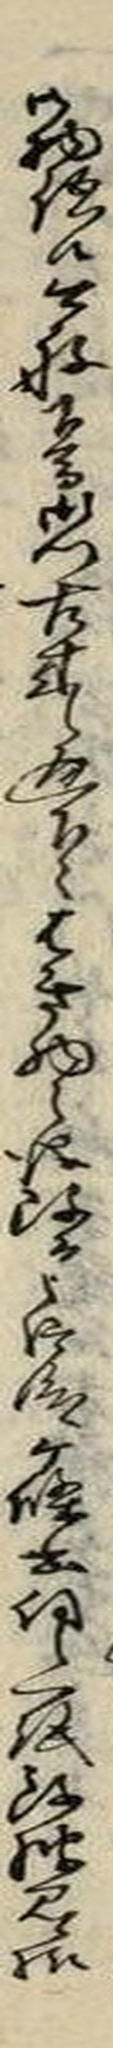御物語候今般下馬御門古来之通下々はき物之儀改而被仰渡候ヶ条書伺候一紙致披見候様
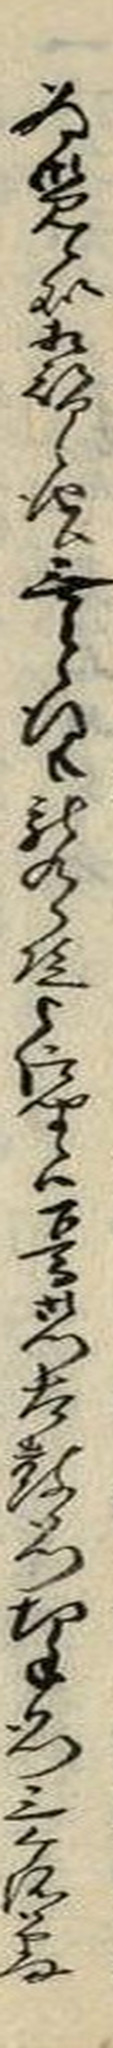為御見候処相替候儀は無之候得共新九郎殿被仰聞候は下馬御門太鼓御門切手御門三ヶ所御番
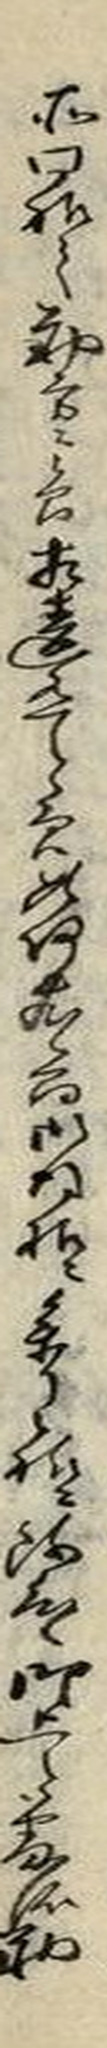所同様之勤方に候間相違有之候而は如何敷候間御同様に被参候様に致度候御上之御番所勤
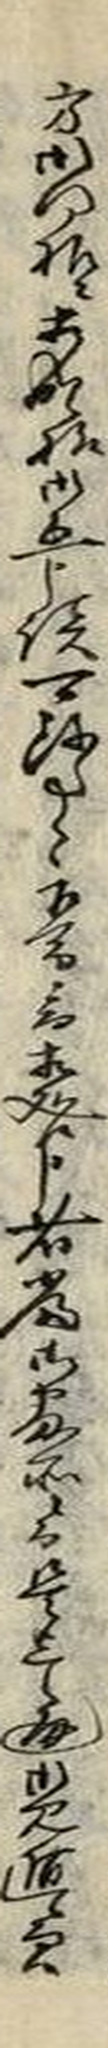方御同様に相成候様御互申談可致事に候下馬に而相咎申者当御番所に而是迄之通御見遁候而は
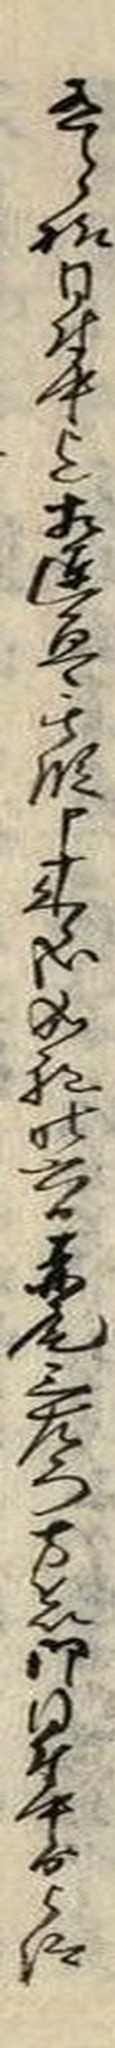有之候様目付中迄相達互に其段申来候哉成程昨六日赤尾三左衛門方を以御目付中ゟ被仰
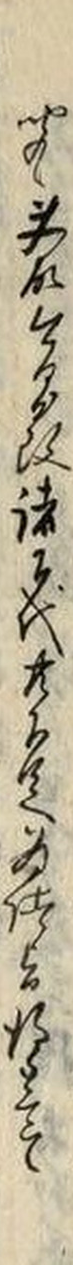聞候夫故今日ゟ改諸下人共下足為仕候旨得御意候
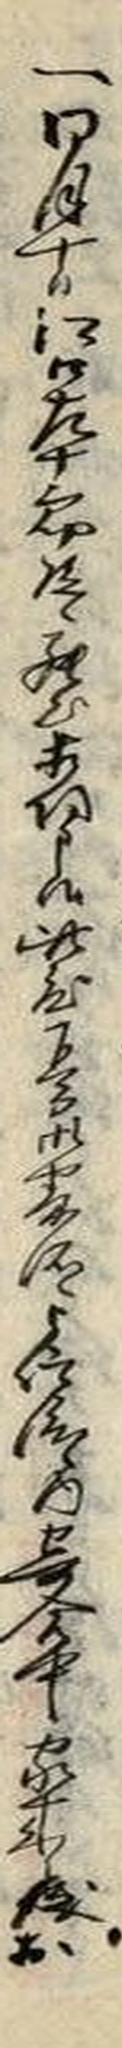一同月十日江口左十郎殿へ罷出相伺申候此度下馬御番所へ被仰渡候内寄合中家来儀於
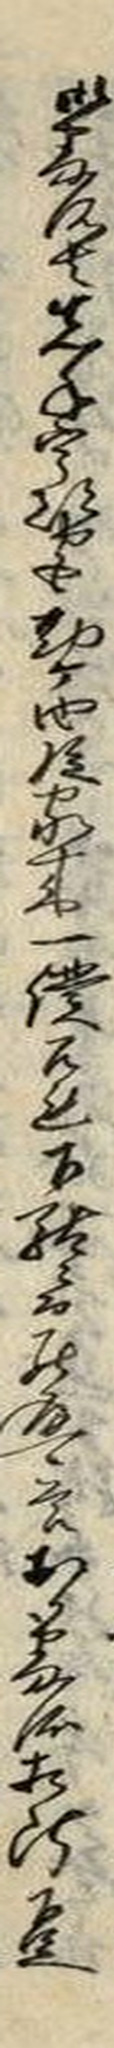御番所は先年宇都宮勘ヶ由殿家来一僕召連下駄に而罷通候節於御番所相断下足
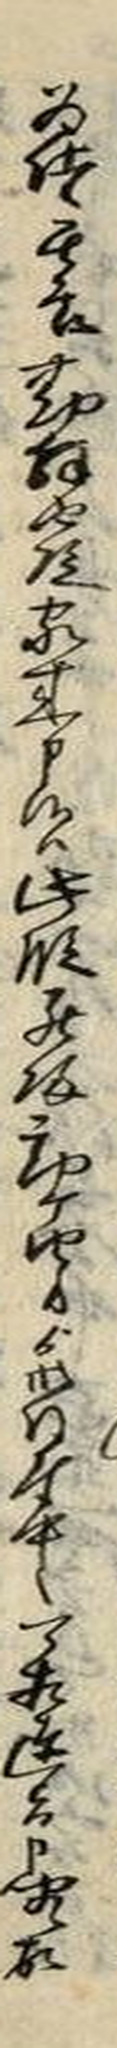為仕候其節勘解由殿家来申候は此段罷帰解ヶ由方ゟ御目付中へ可相達候旨申聞候故
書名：御門御櫓之部
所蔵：福井県文書館 Fukui Prefectural Archives
